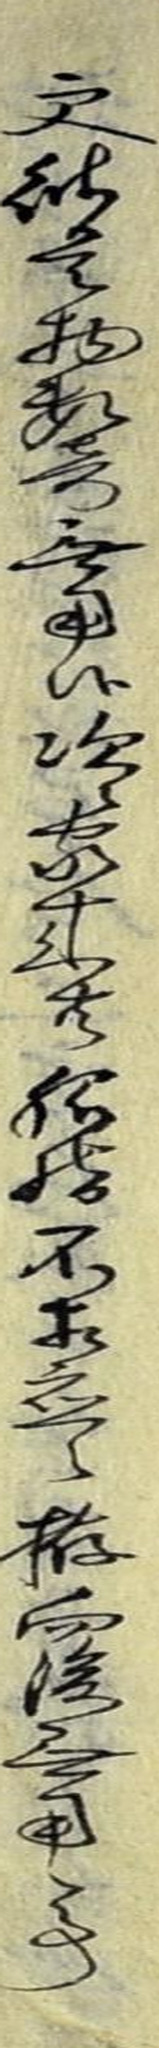更彼是物数奇無用候次ニ家来共脇指不相応之拵向後無用候事
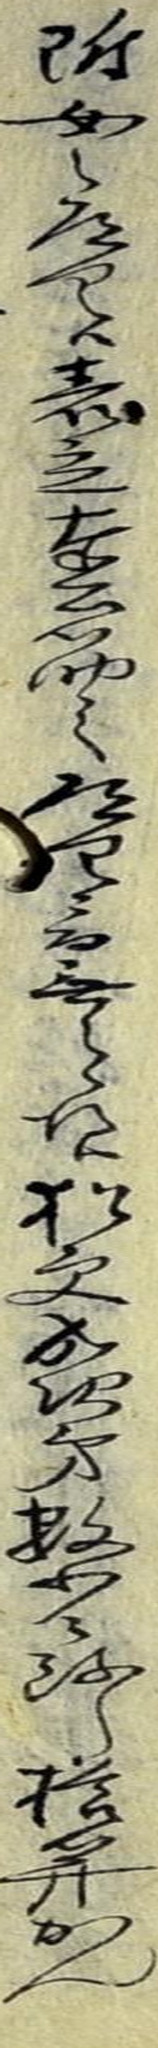附女之道具ハ表立奉公筋之道具ニ而無之候得ハ猶更成次第数少ニ致し櫛笄かん
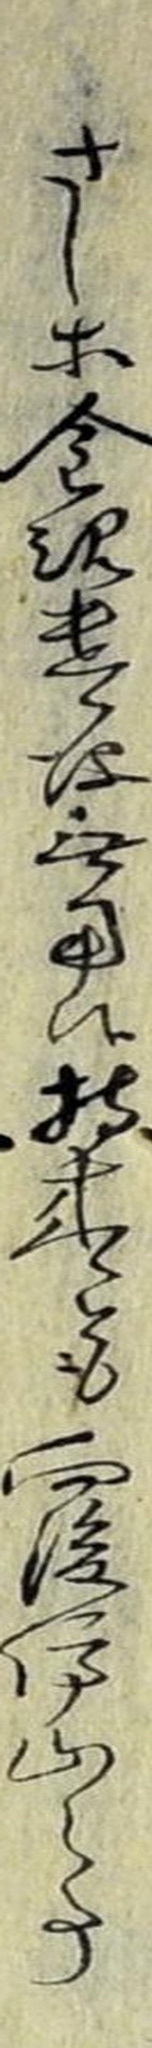さし等金銀遣候儀無用候持来候とも向後停止之事
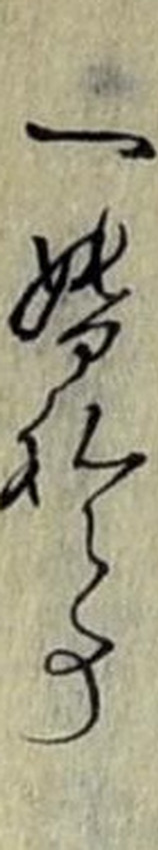一婚礼之事
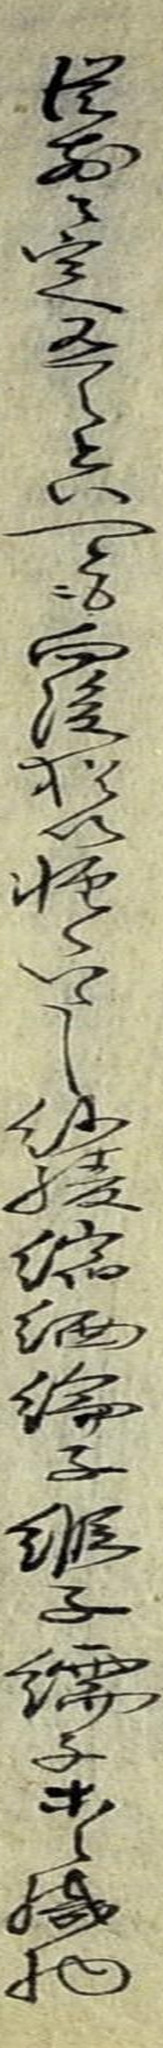従前々定有之といへとも向後猶以軽くいたし紗綾縮緬綸子緞子繻子等之織物
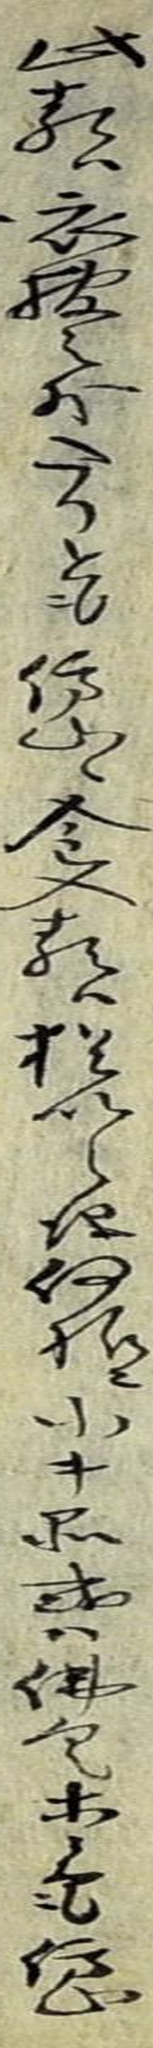此類ハ衣服之外たりとも停止候金入類ハ猶以之儀何様ニ小キ品或ハ仏具等ニ而も停止
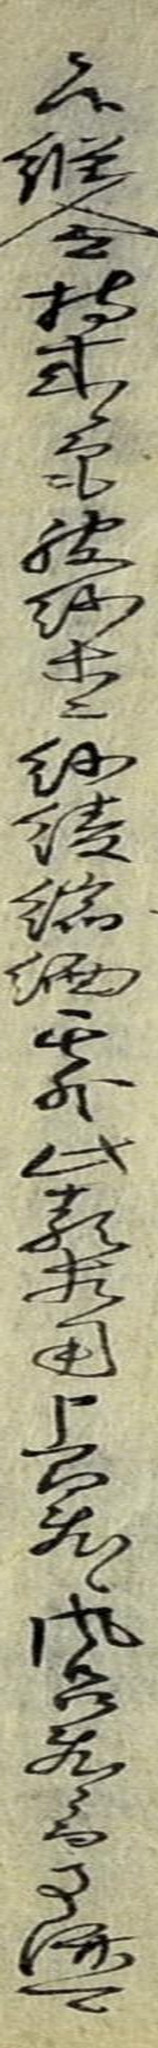ニ候縦令持来候而も服紗等ニ紗綾縮緬其外此類相用申間敷候風呂敷ニ而事済可
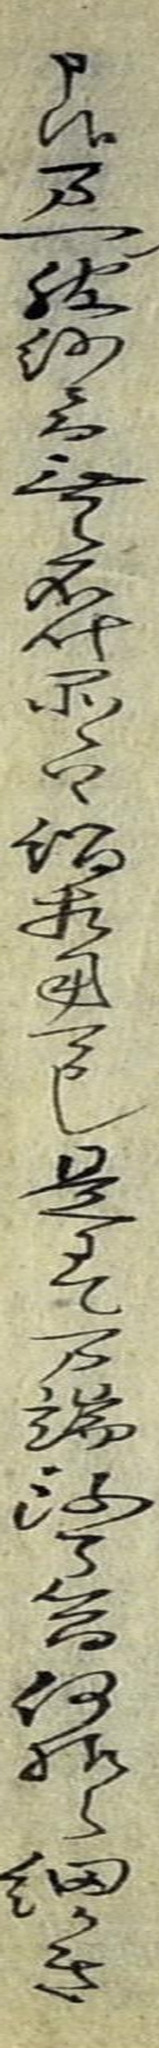申候万一服紗ニ而無之不叶品候ハヽ絹❓相用可申候是にて万端致了簡何様之細かき
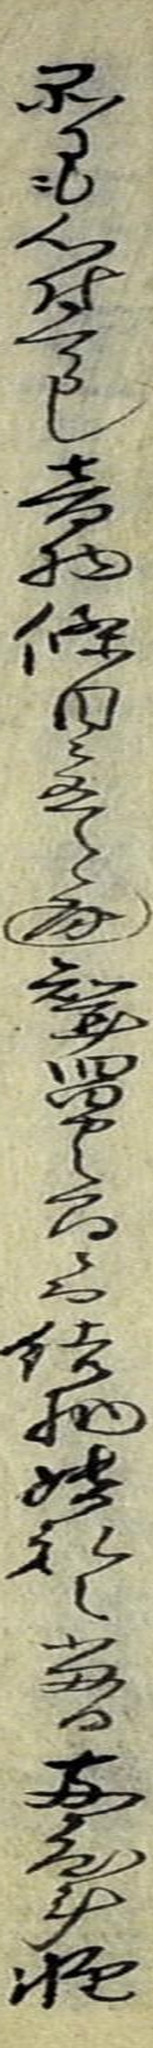品にも心付可申候音物条目ニ有之候通聟舅之間ニ而結納婚礼之当日両度斗軽
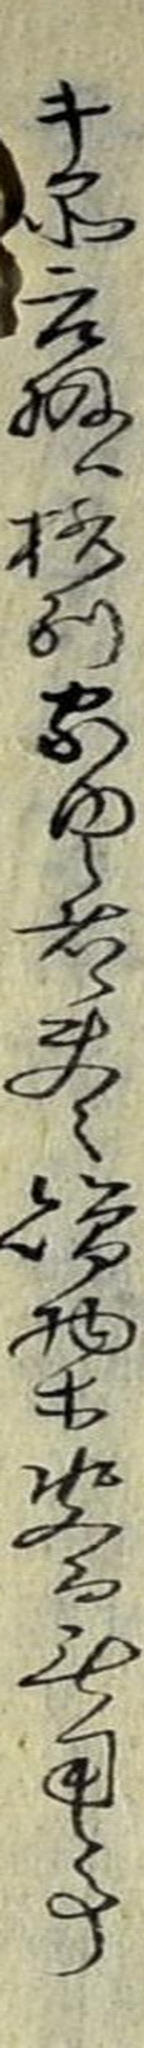キ品取扱ハ格別家内之者へ夫々贈物等決而無用之事
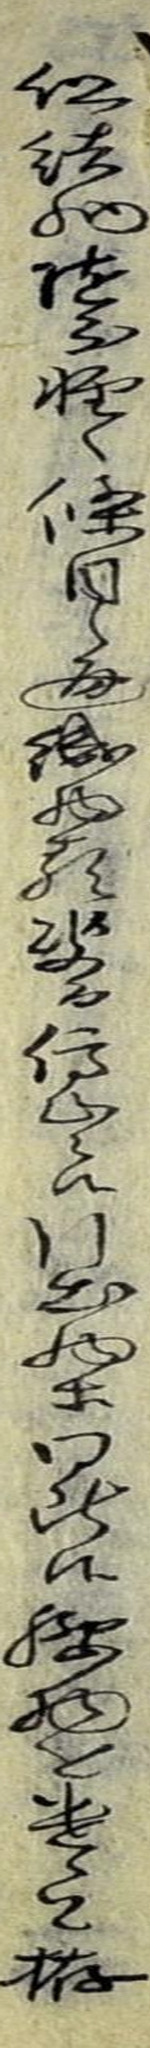但結納随分軽く条目之通織物類決而停止ニ候引出物等同断候腰物を遣候ハヽ拵
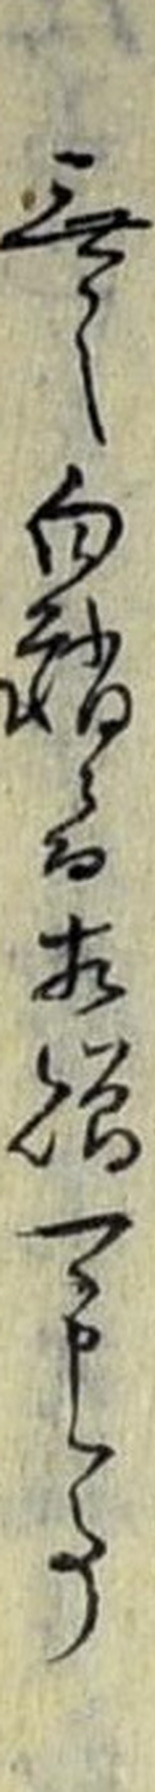無之白鞘ニ而相贈可申候事
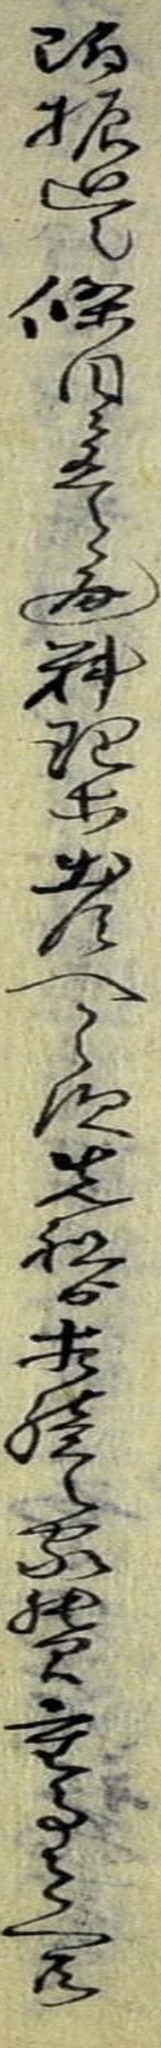附振廻之条目ニ有之候通料理等出すへからす先祖ゟ相続之家督ハ重事ニ候へ共
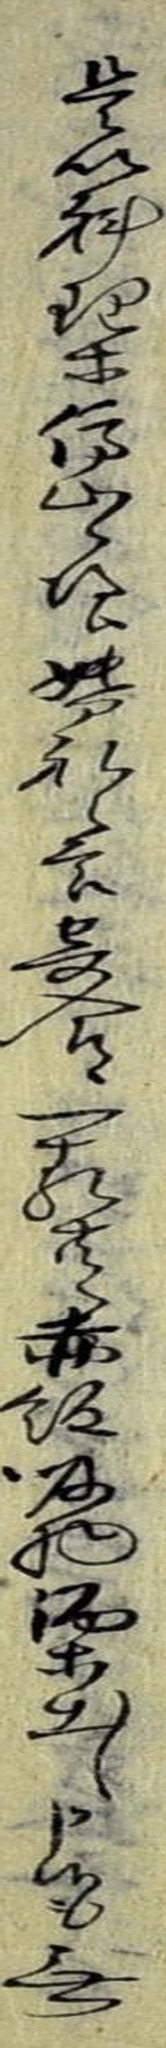是以料理等停止候得ハ婚礼之節寄合候一類共へ赤飯吸物酒等出し申候も無
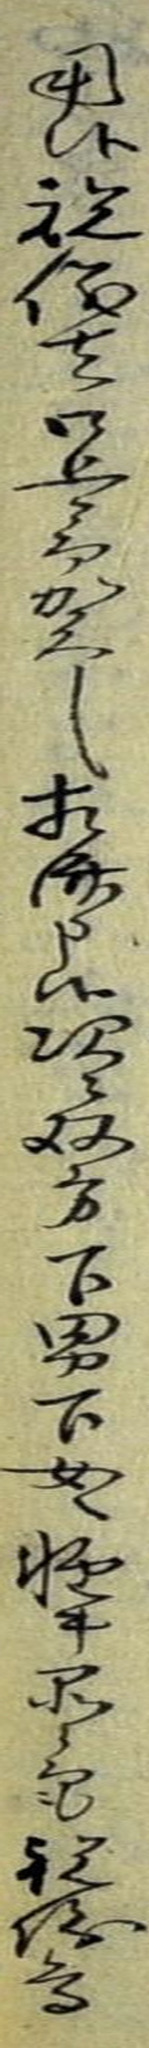用候祝儀者口上ニ而賀し相済申候次ニ双方下男下女へ軽キ品ニ而も祝儀鳥
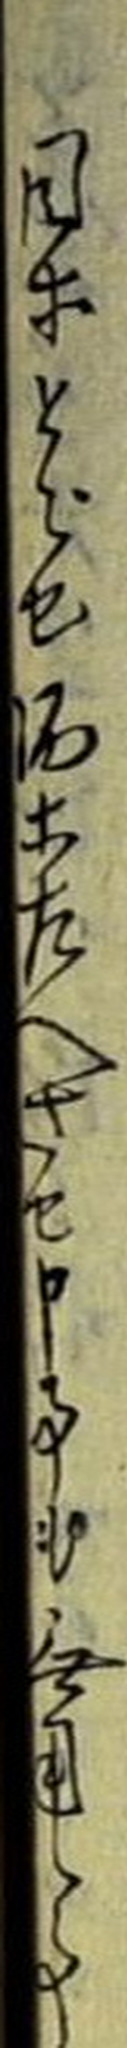目等とらせ酒等たへさせ申事も無用之事
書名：命令之部 一
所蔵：福井県文書館 Fukui Prefectural Archives
